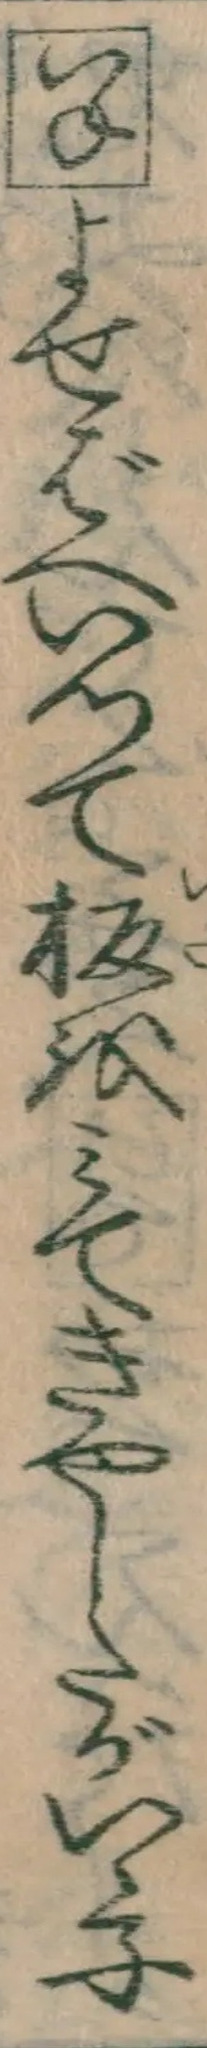〈いね〉よせばへいつて板をみてきやしたがいゝ子
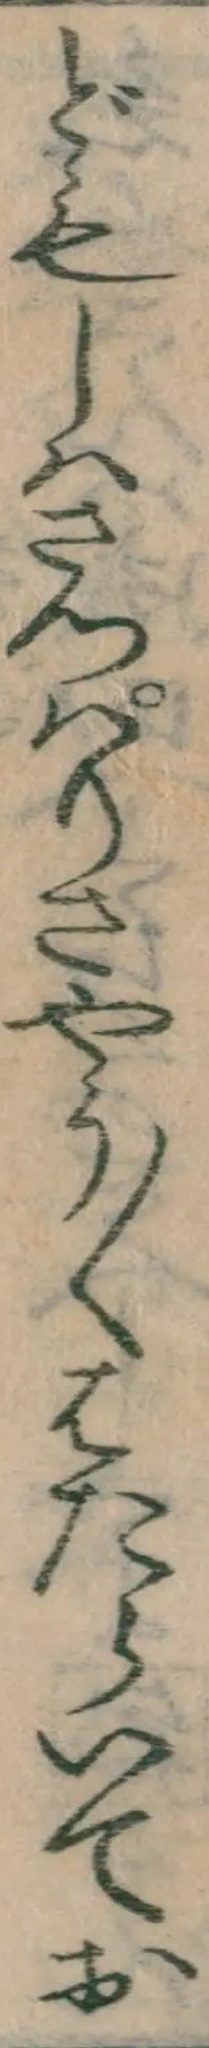どもしはさつぱりさやう〳〵はたらいてお
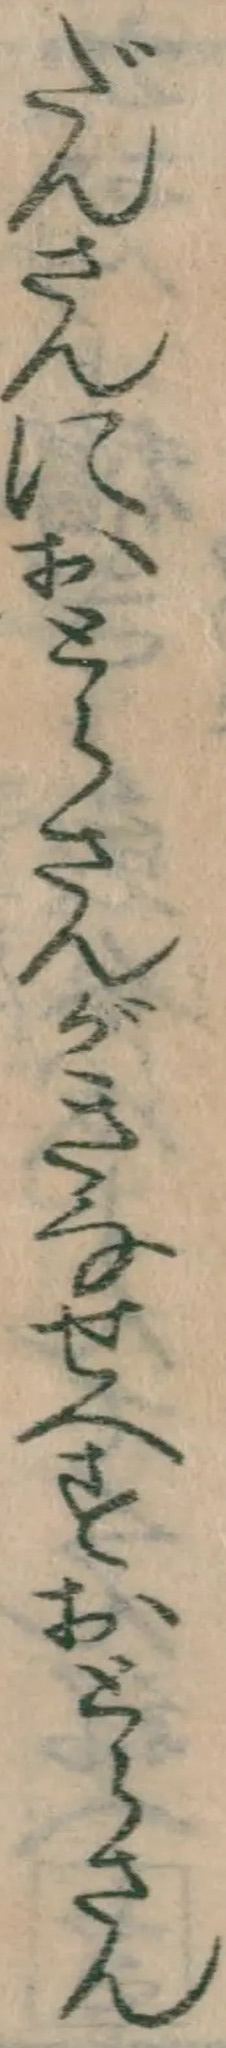だんさんにおとらさんがきなせへすおとらさん
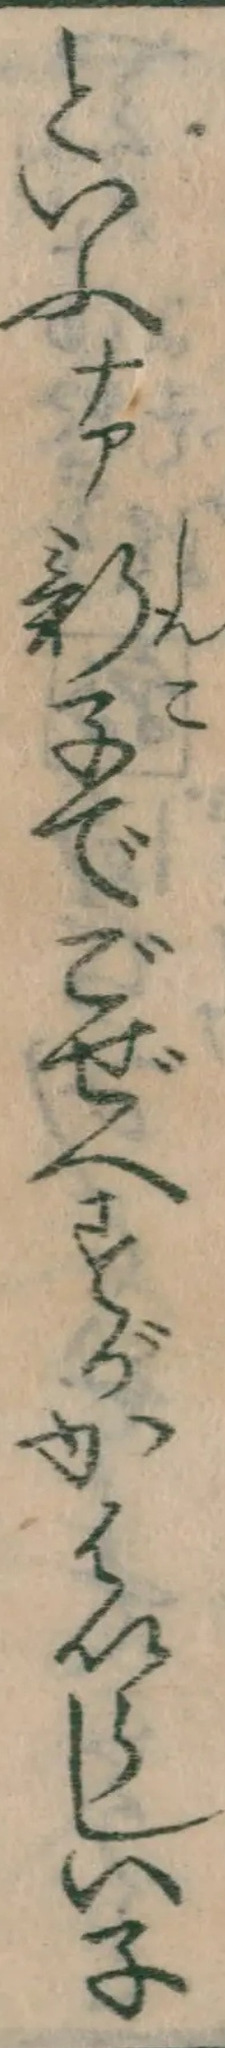といふナア新子でごぜへすがかはいらしい子
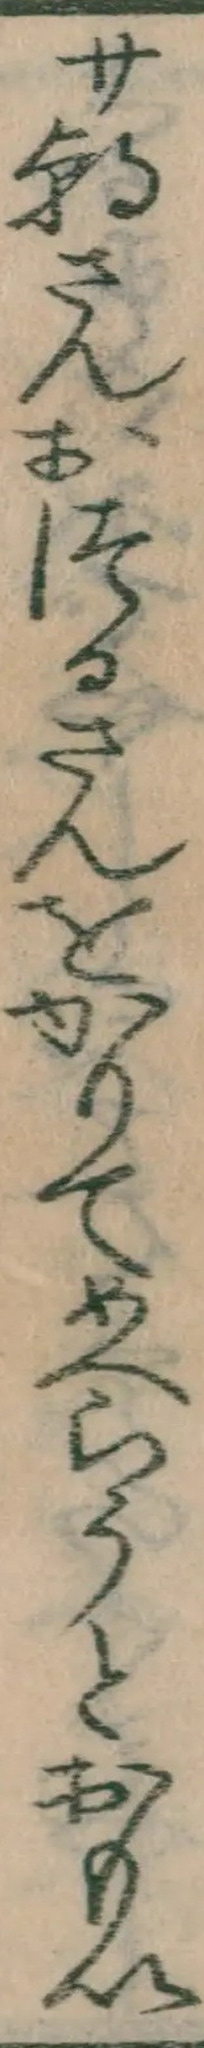サ朝さんおつるさんをかりてめへらうとおもい
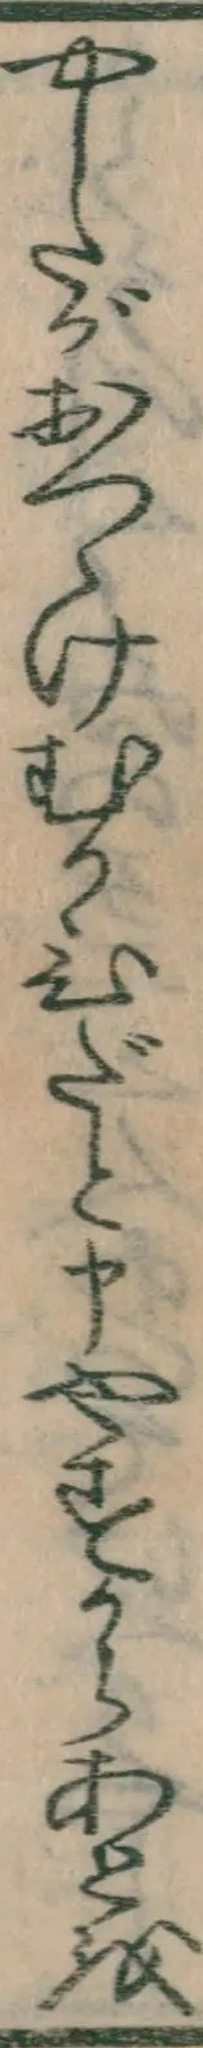やしたがおつゝけむかひだと申やすからあとを
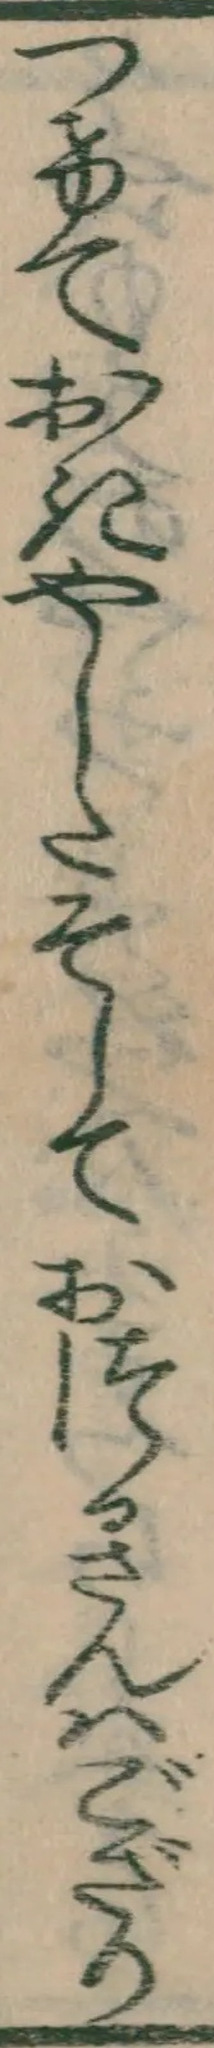つけておきやしたそしておつるさんはござり
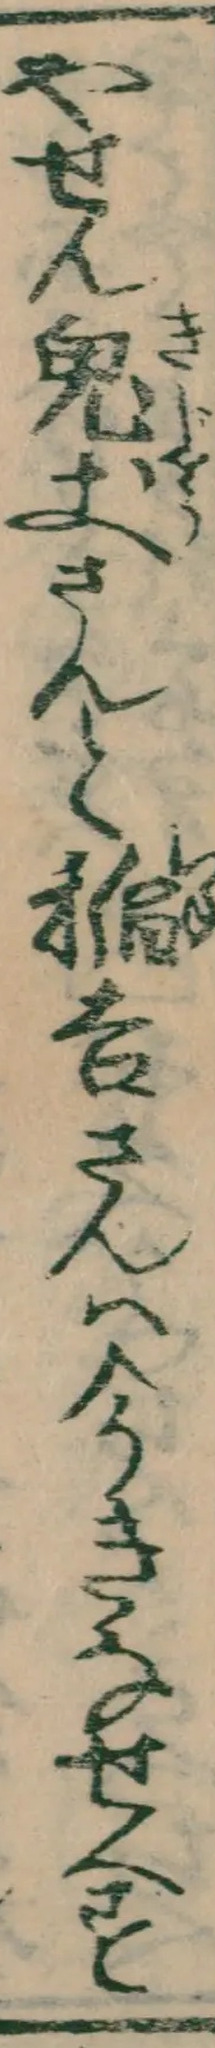やせん鬼丈さんと稲吉さんは今きなせへす
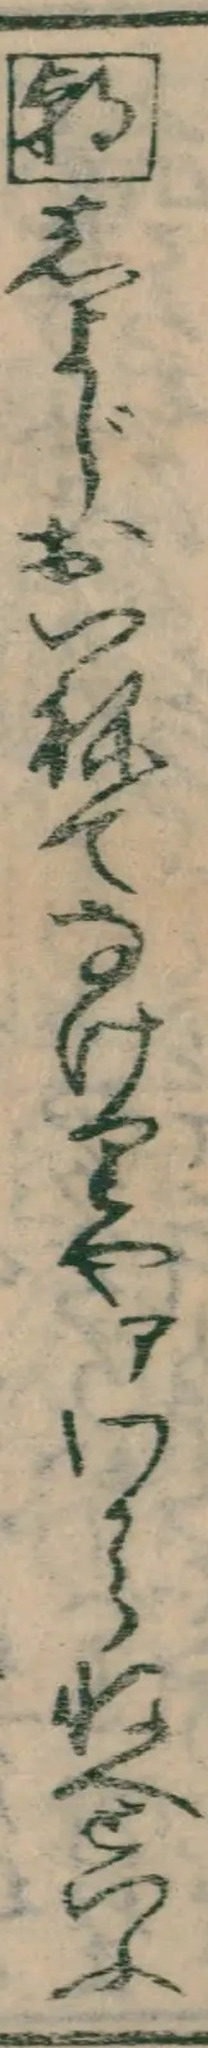〈朝〉しよじおいねてなけりやァわからねへといふ
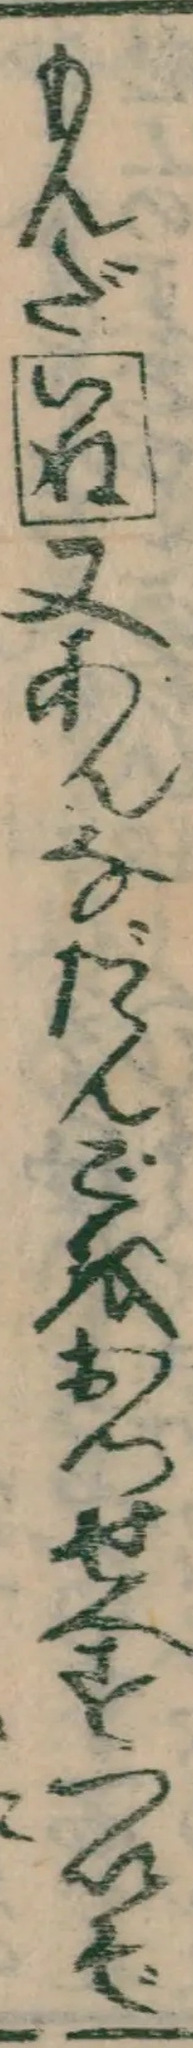もんだ〈いね〉又あんなだんごをおつせへすついぞ
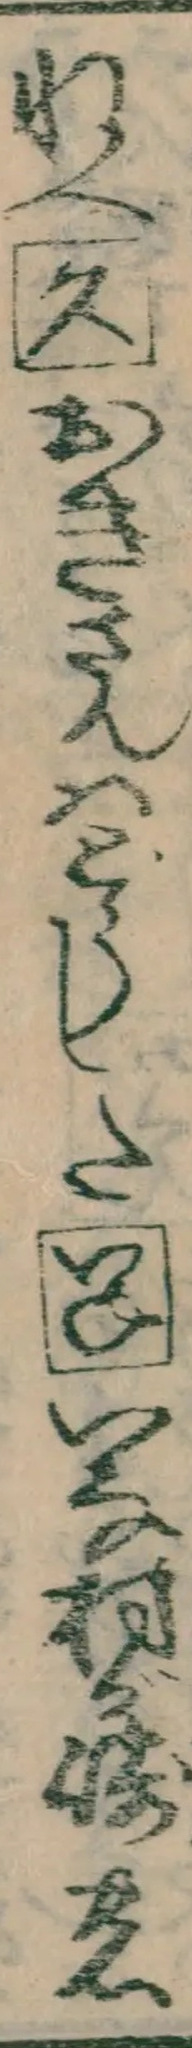ねへ一色おきさんはどうした「いな羽が崎の

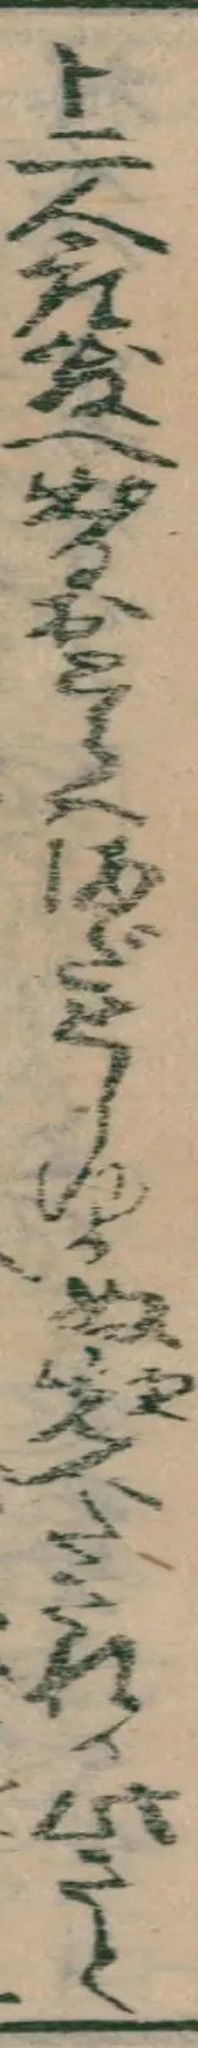ト二人座敷へ出るおとらはまだとしゆかぬ先へたされる此さと
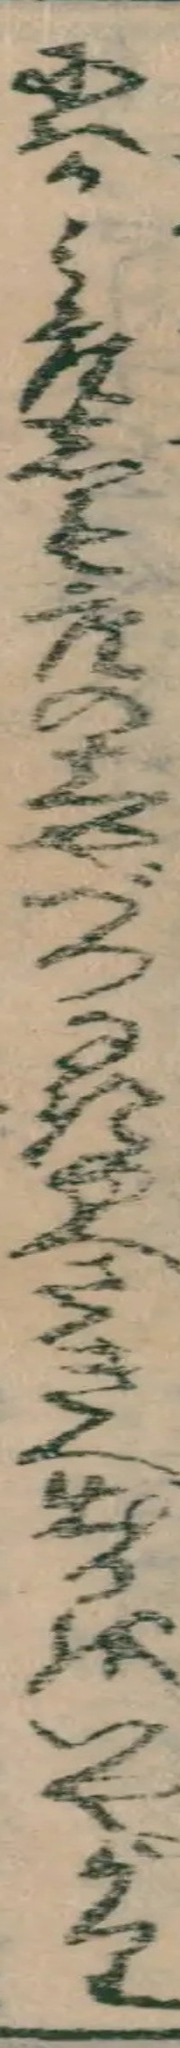にはかみ座しも座のしやべつなきゆへさへ出るをいやがり
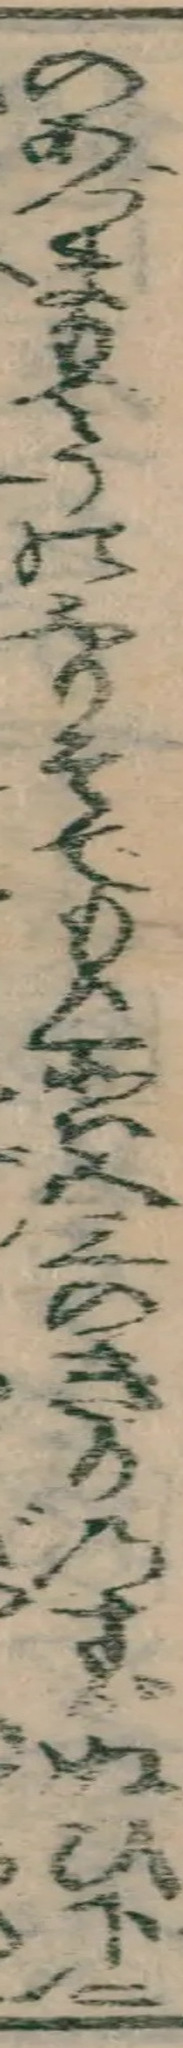のあづまもやうのふりそでもん所は五三のきりのすがぬひ下に
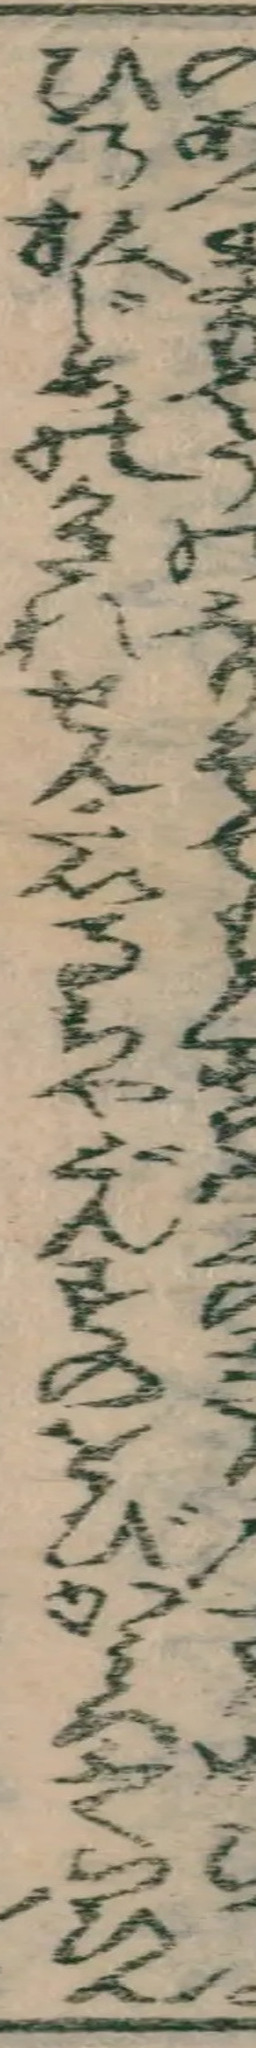ひの板じめのかされせんさい寺ちやどんすのをびかみはふくらひん
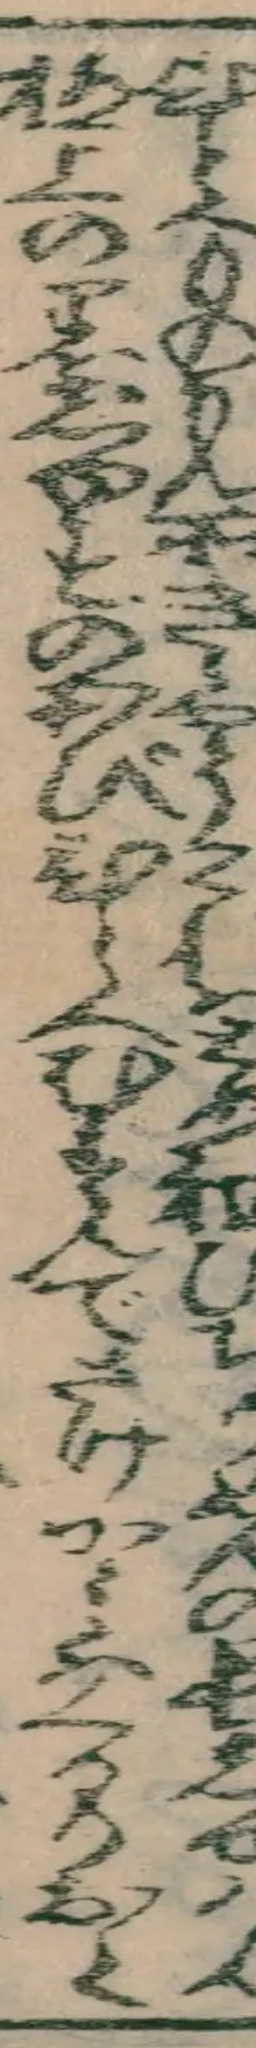極上の黒じゆすのおびひとへむすんでさけかみはくるりおと
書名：教訓読本：大礒風俗仕懸文庫
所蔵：国立国会図書館 National Diet Library, JAPAN
